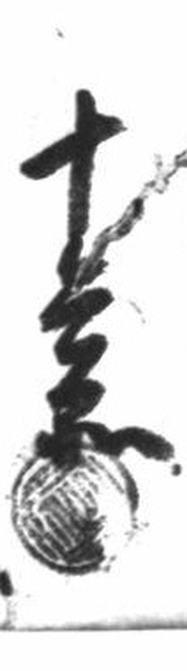忠兵衛
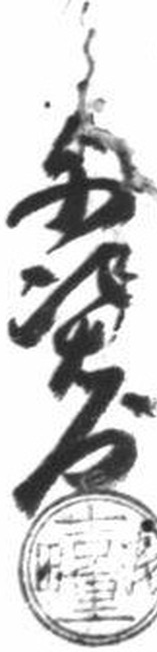与次右衛門
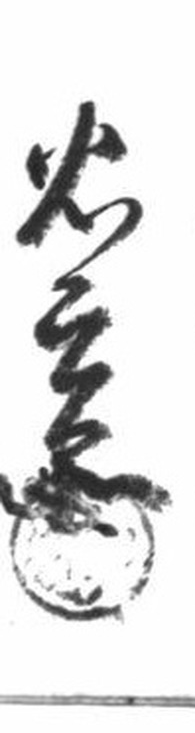忠兵衛
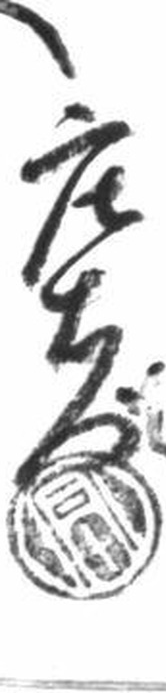庄右衛門
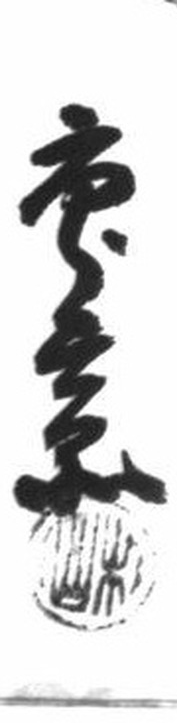市郎兵衛
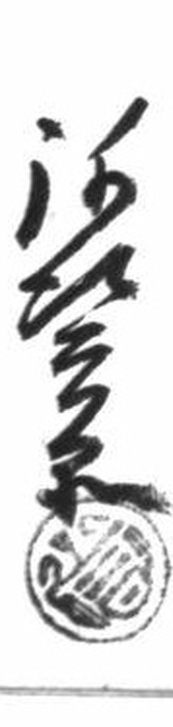弥次兵衛
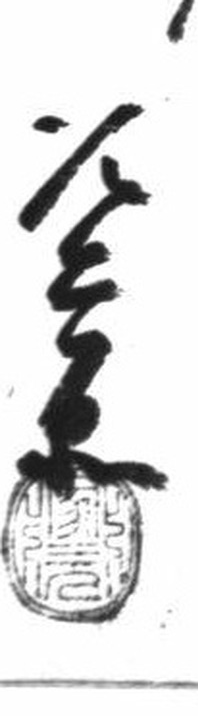次兵衛
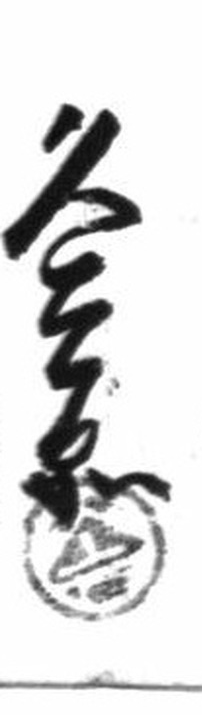久兵衛
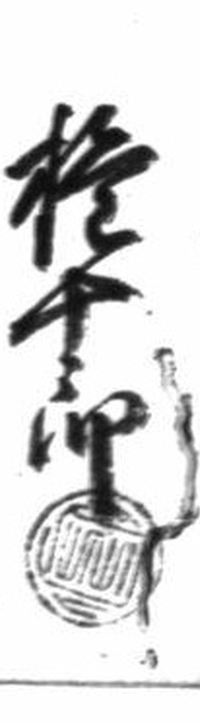権十郎
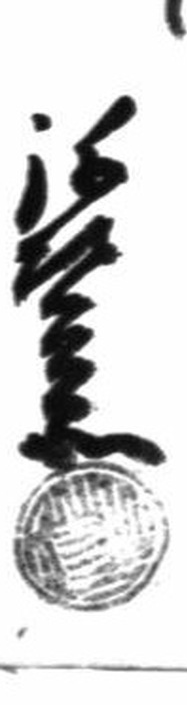弥次兵衛
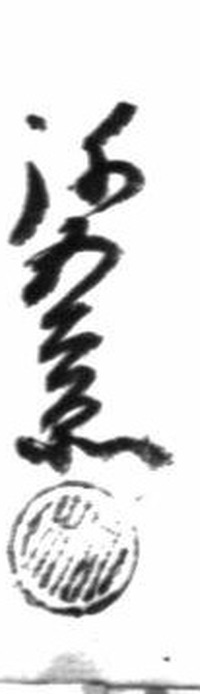弥五兵衛
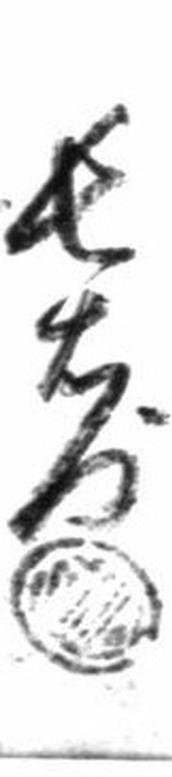長右衛門
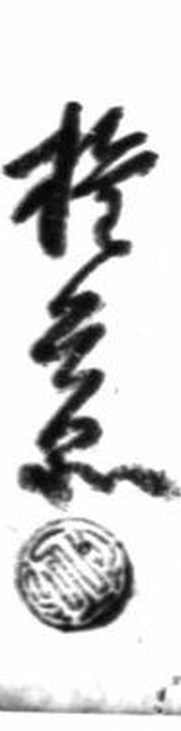権兵衛
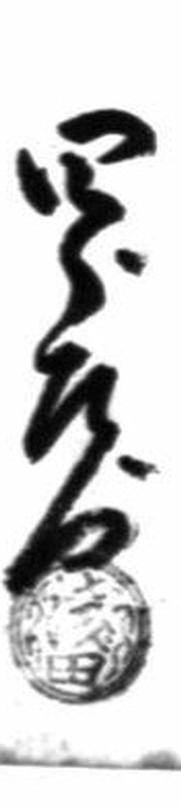四郎左衛門

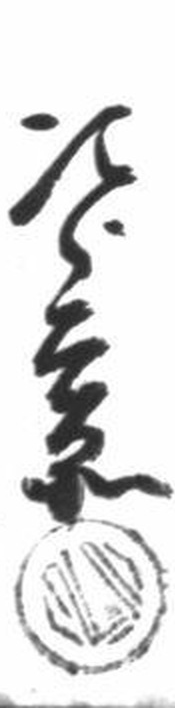次郎兵衛
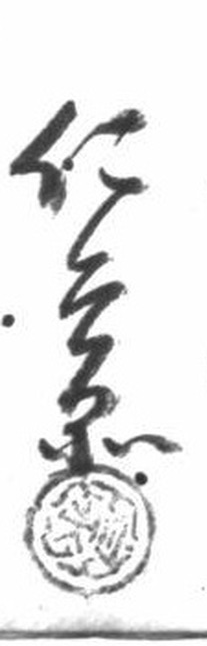仁兵衛
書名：宝永弐酉五月火之用心護摩之灰御改帳証文
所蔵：福井県文書館 Fukui Prefectural Archives
